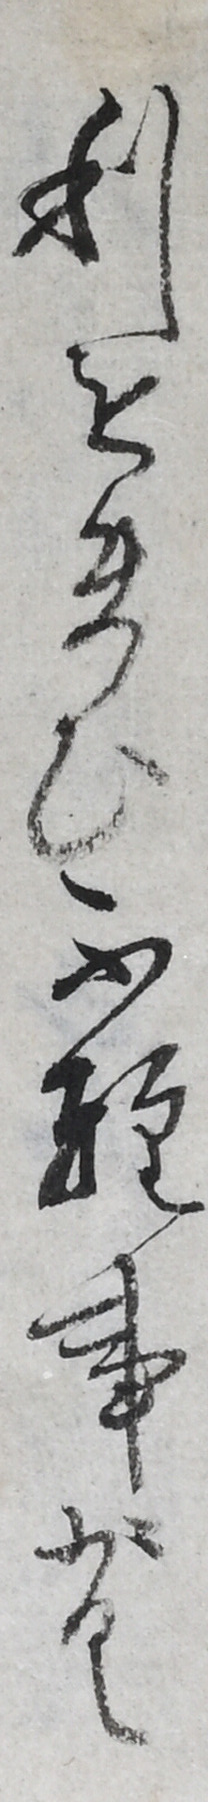利を失ひ不軽事ニ有之
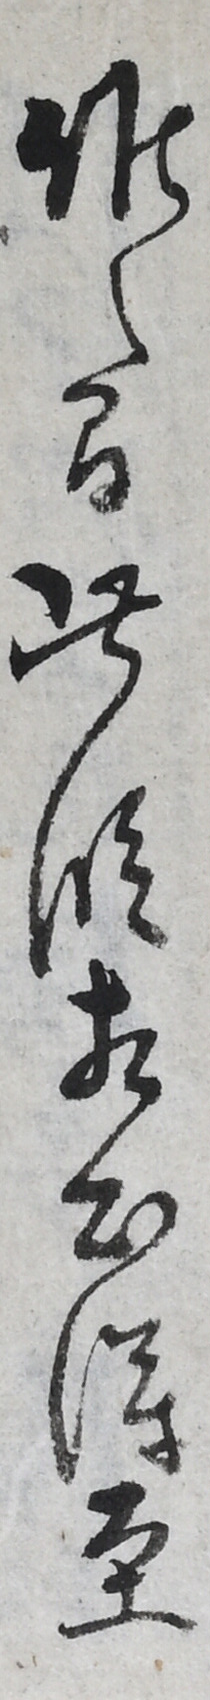候之間此段相心得至
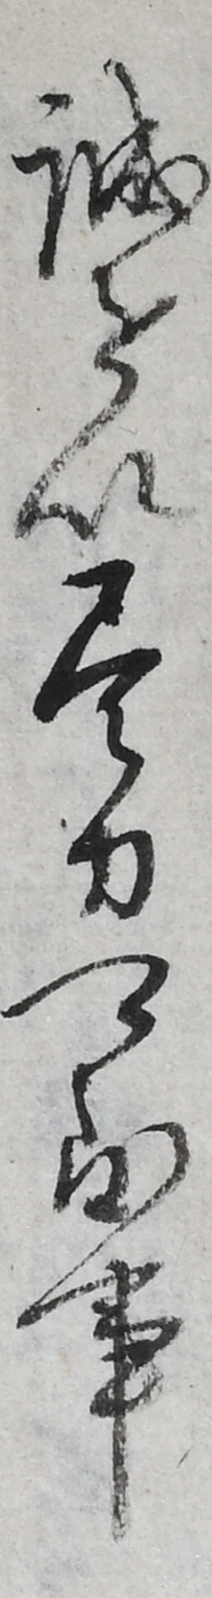誠を以尽力可致事
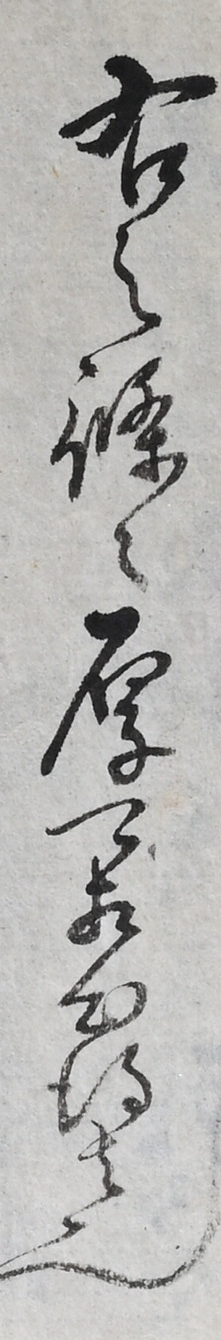右之條々厚可相心得者也
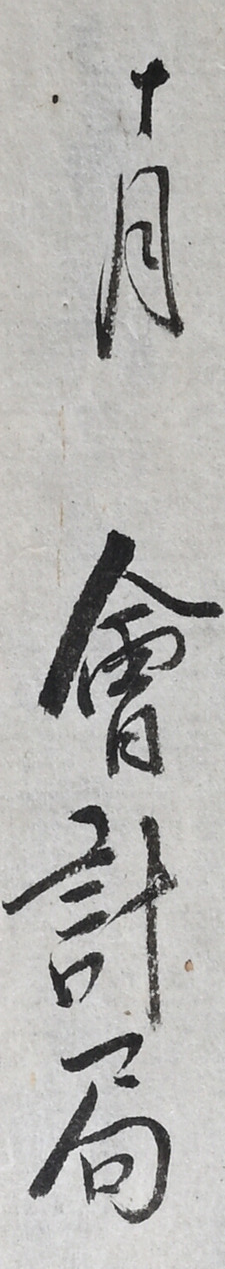十月会計局
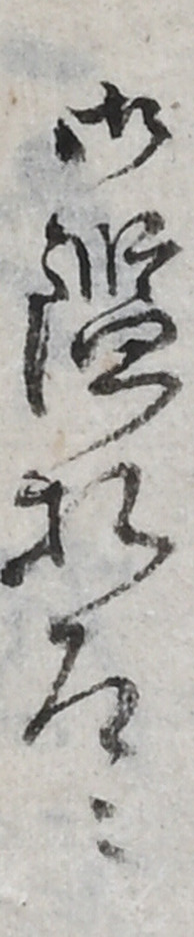御鑑札左ニ
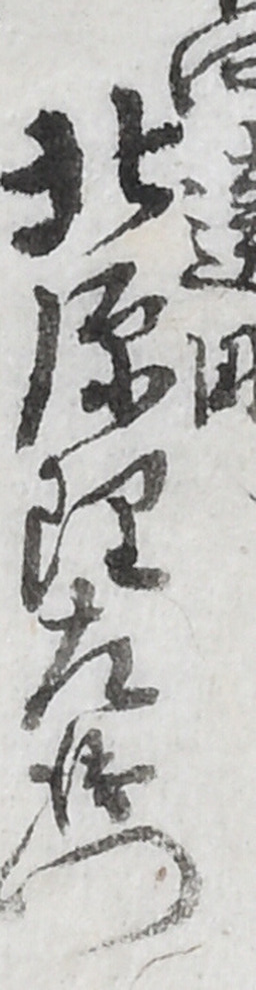北原理左衛門
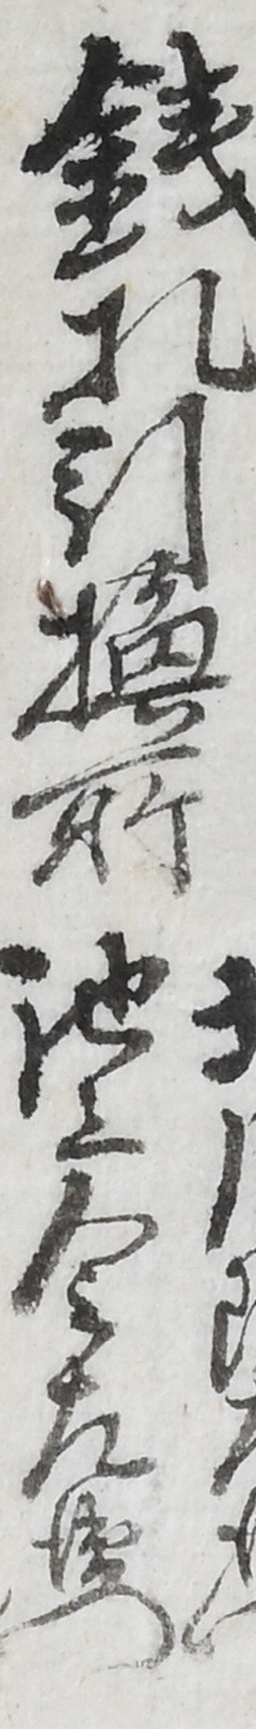銭札引換所池上金左衛門
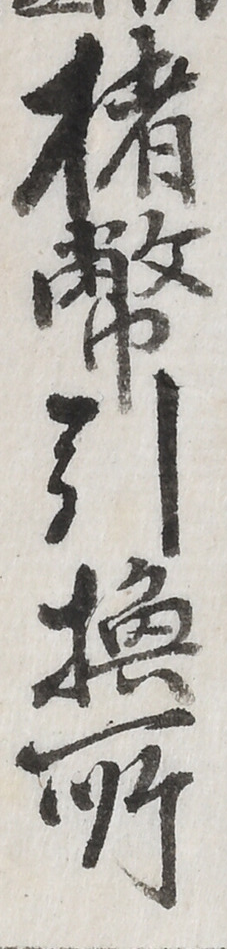楮幣引換所
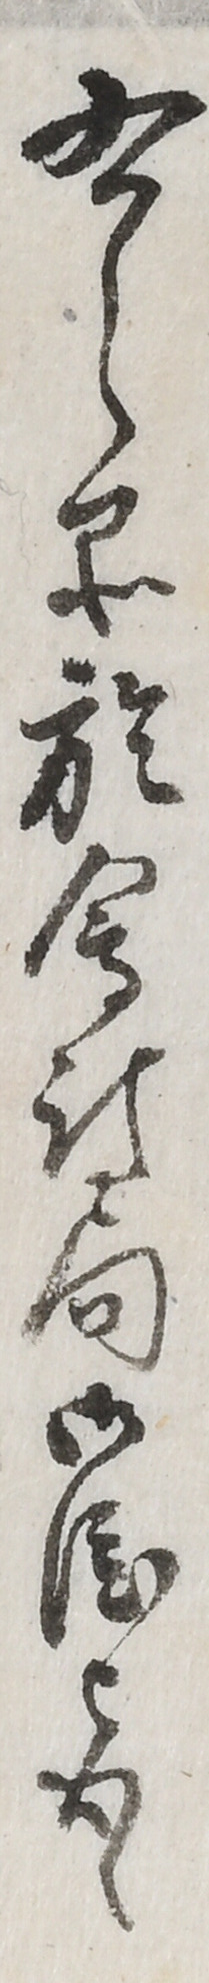右之品於会計局御渡被成候
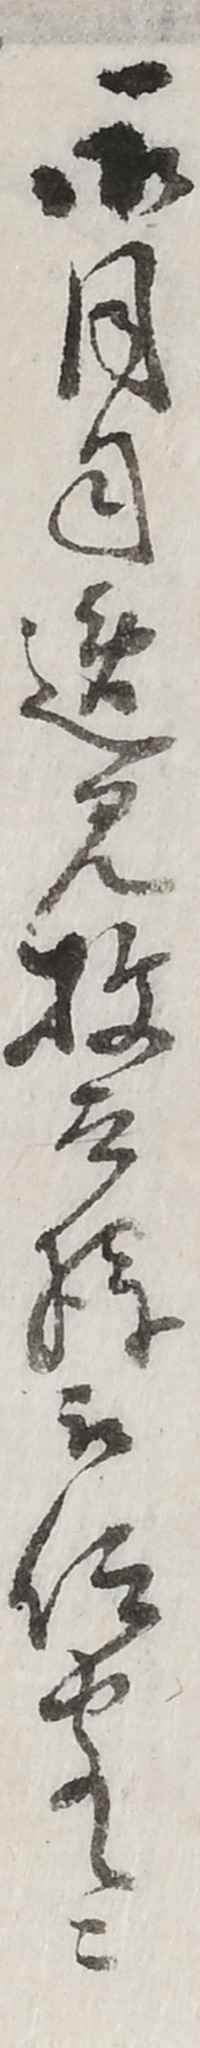一御月司逸見牧太様被仰聞候ニ
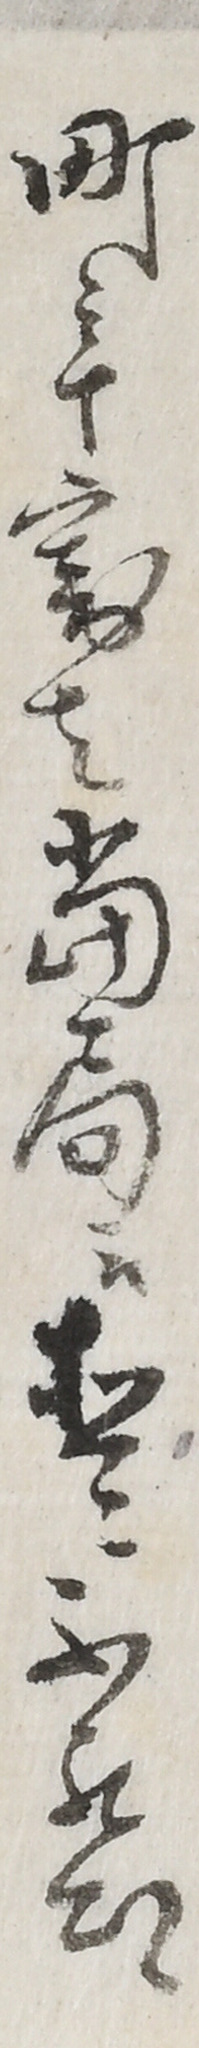町年寄者当局江直ニ不罷出候
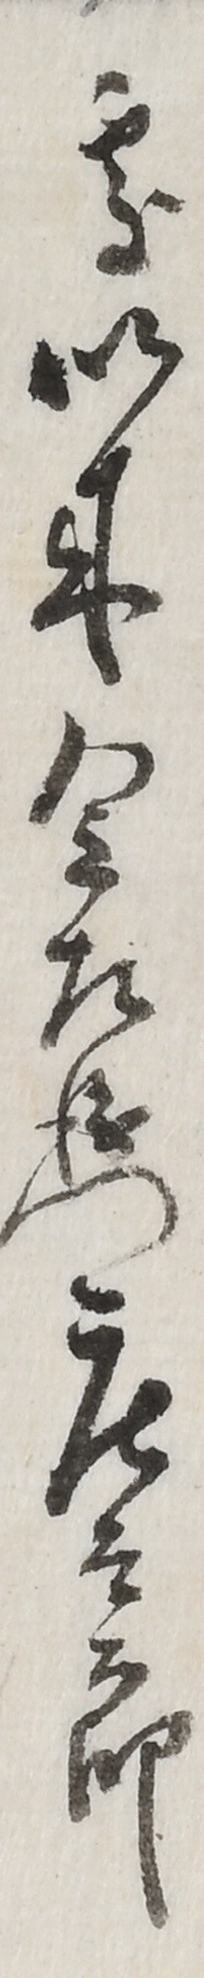処以来金左衛門庄太郎
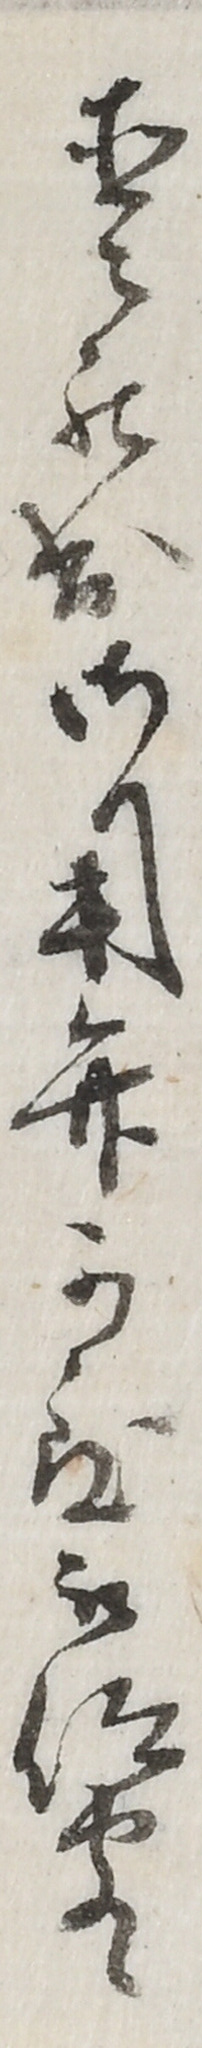直ニ罷出御用弁可致被仰聞候
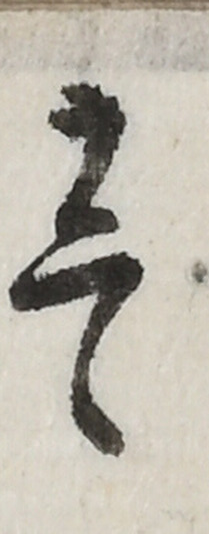十二日
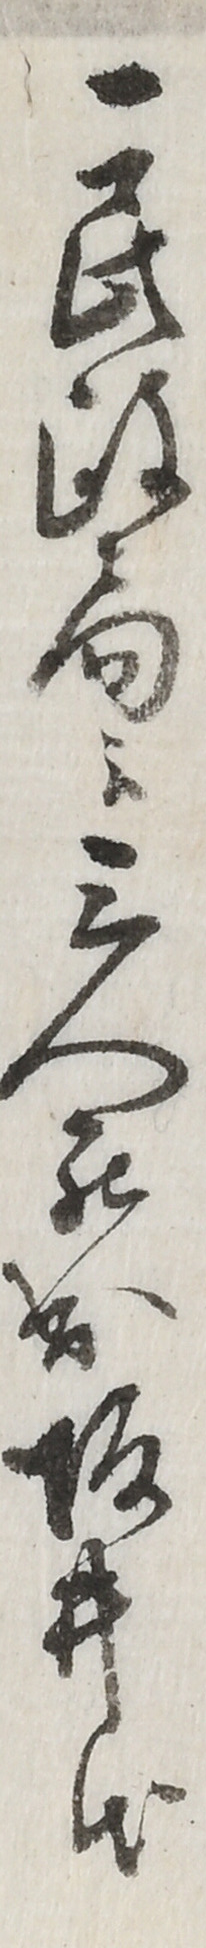一民政局江三人罷出坂井氏
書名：信濃全國楮幣引換御用控
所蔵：伊那市立高遠町図書館・合同会社AMANE
